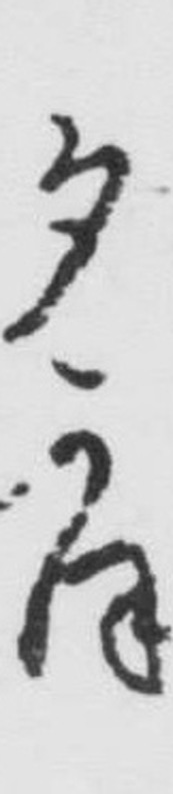夕かほ
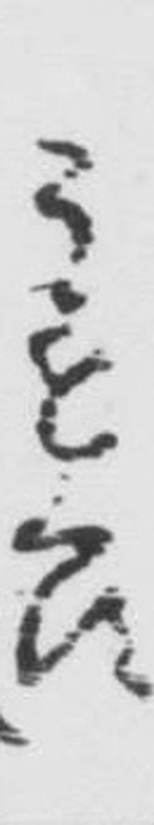うすくず
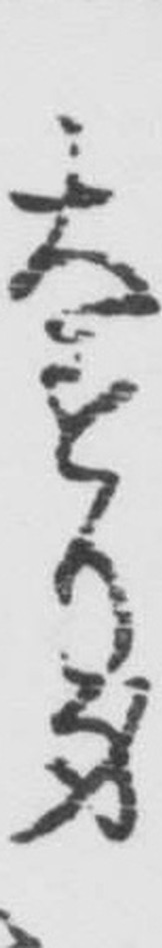大すり身
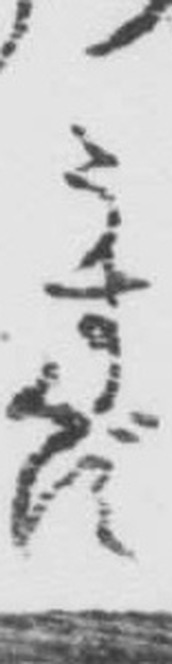うすくず
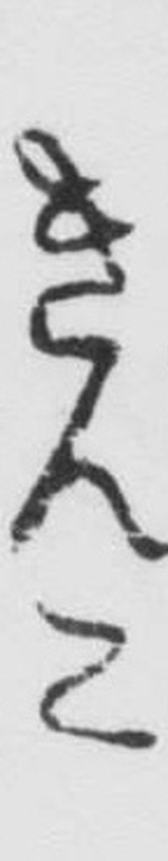きんこ
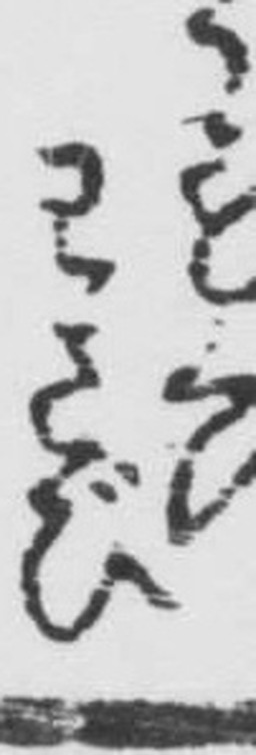わさび
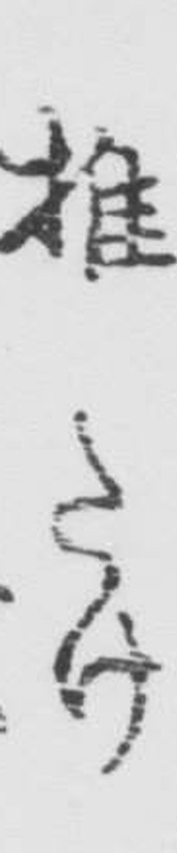椎たけ
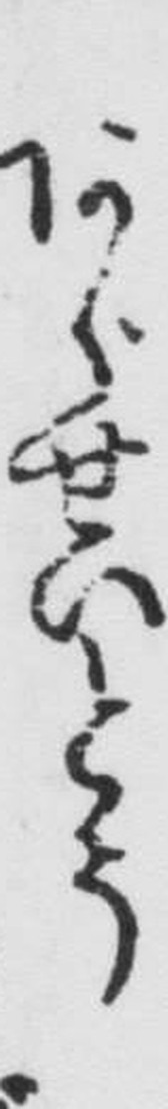あらせいとう
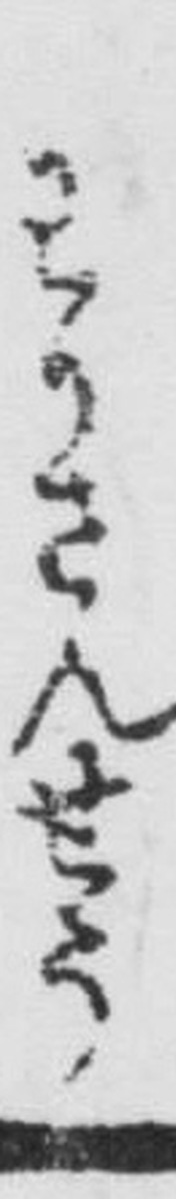さりさんせう
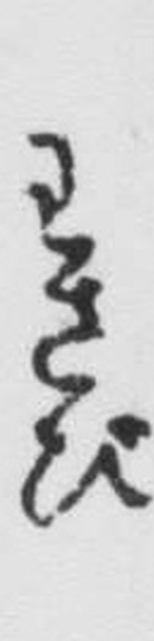わさび
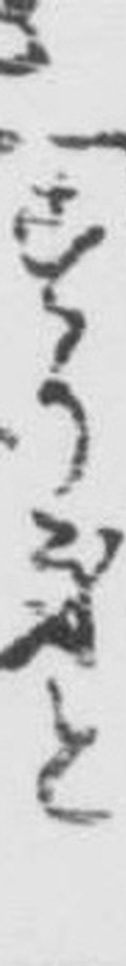〽すり身と
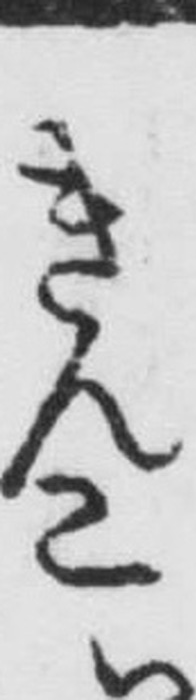きんこ
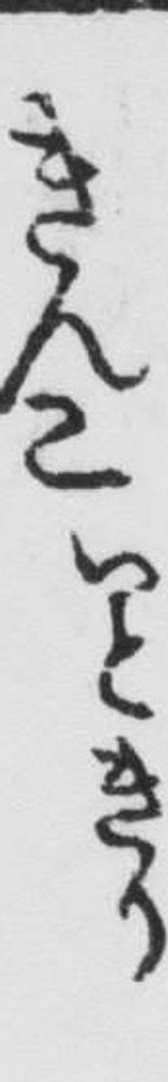きんこいときり
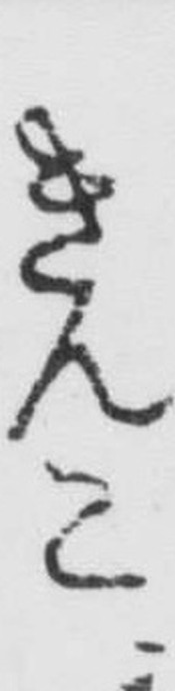きんこ
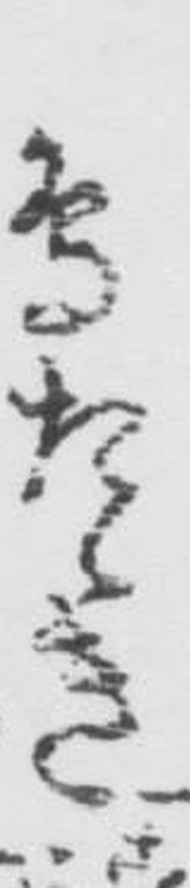鳥たゝき
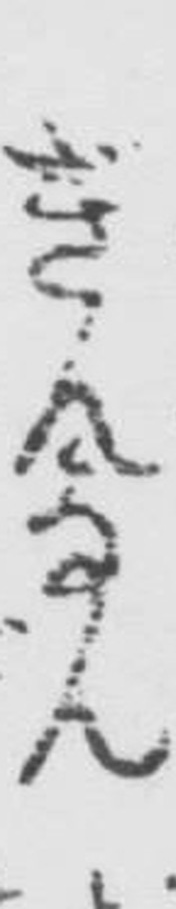ぎんなん
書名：諸家通用/即席料理
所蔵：大阪府立大学学術情報センター 国文学研究資料館
